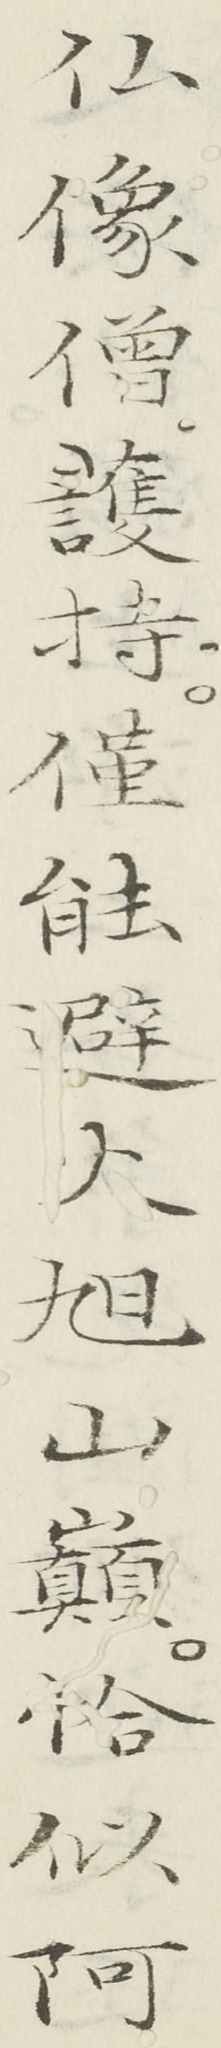仏像僧護持。僅能避大旭山顛。恰似阿
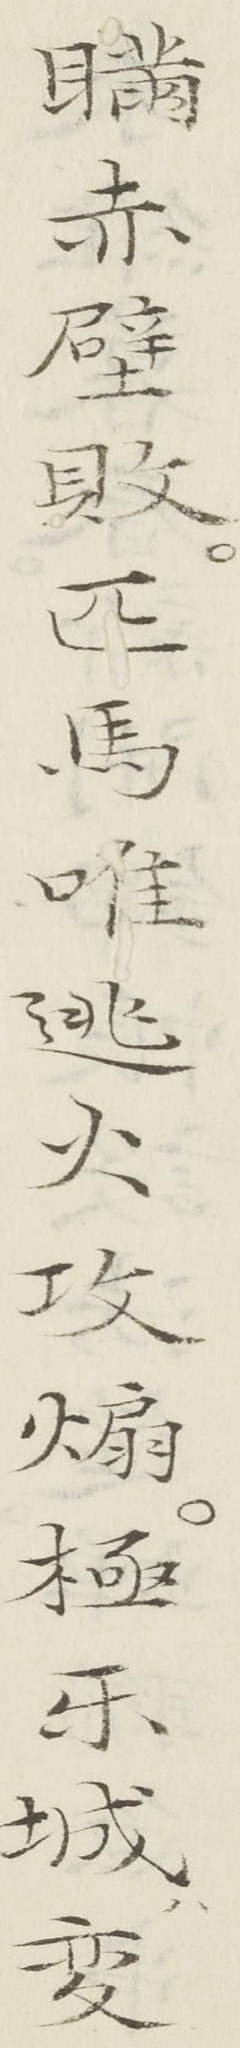瞞赤壁敗。匹馬唯逃火攻煽。極牙城変
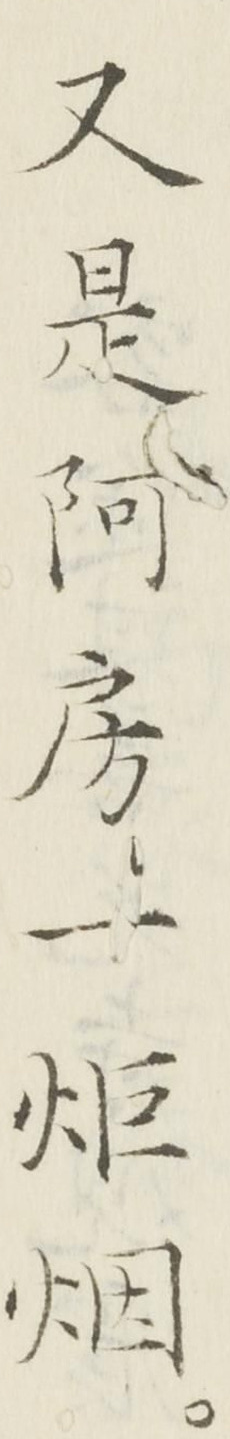又是阿波一炬烟。
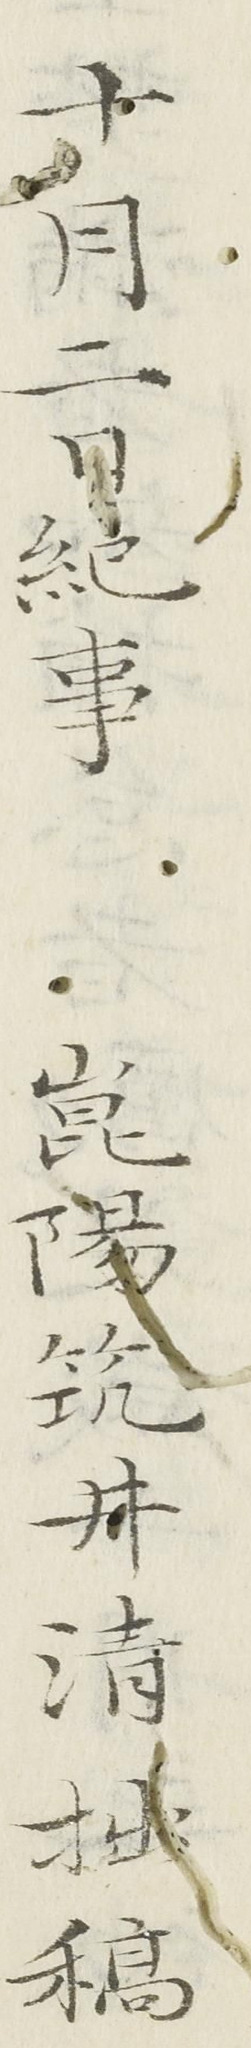十月二日紀事崑陽筑井清拙稿
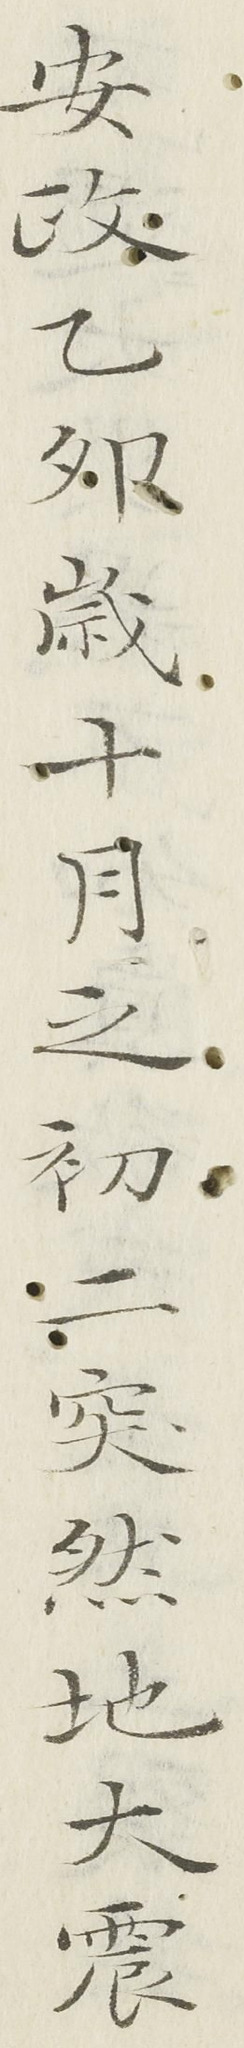安政乙卯歳十月之初二突然地大震
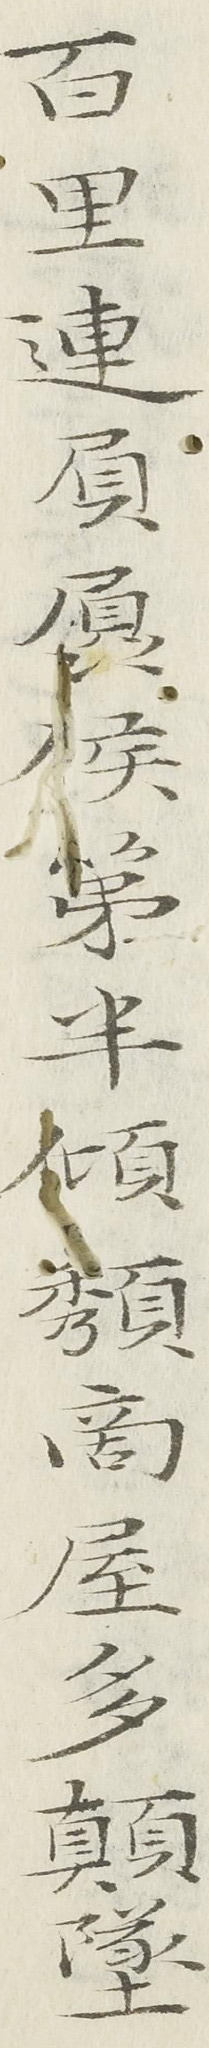百里連屓侯第半傾頽啇屋多顚墜
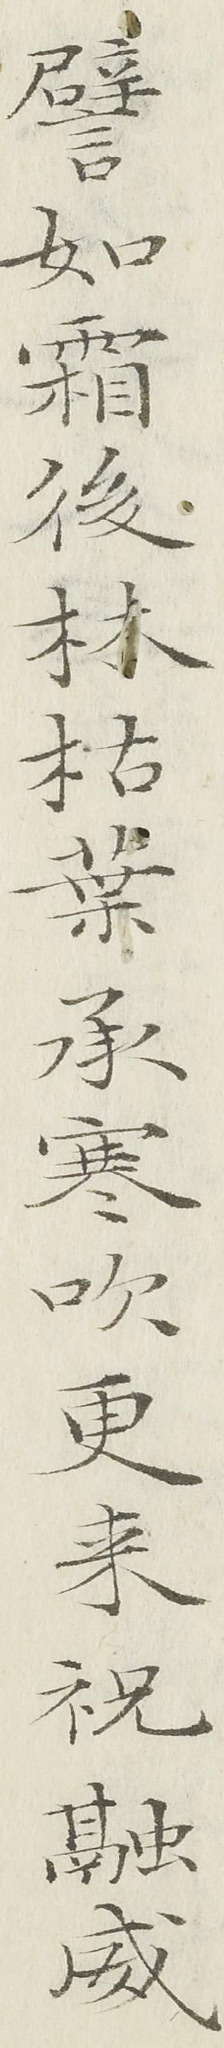譬如霜後林枯葉承寒吹更来祝融威
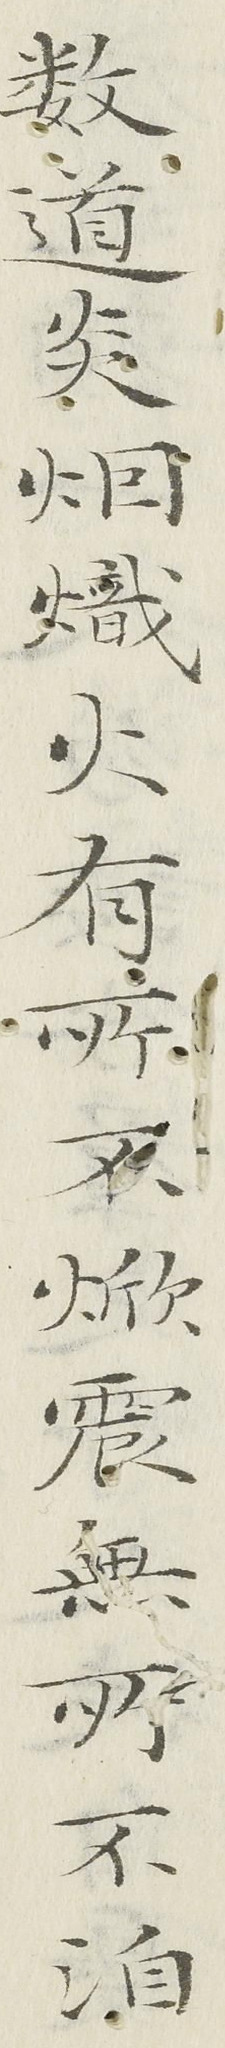数道炎炯識火有所不震無所不泊
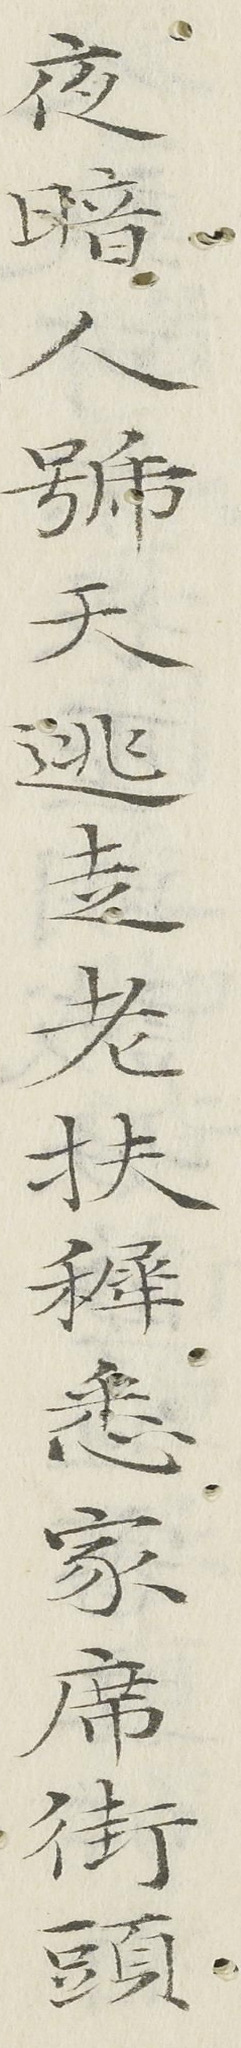夜暗人号天逃走老扶穉悉家席街頭
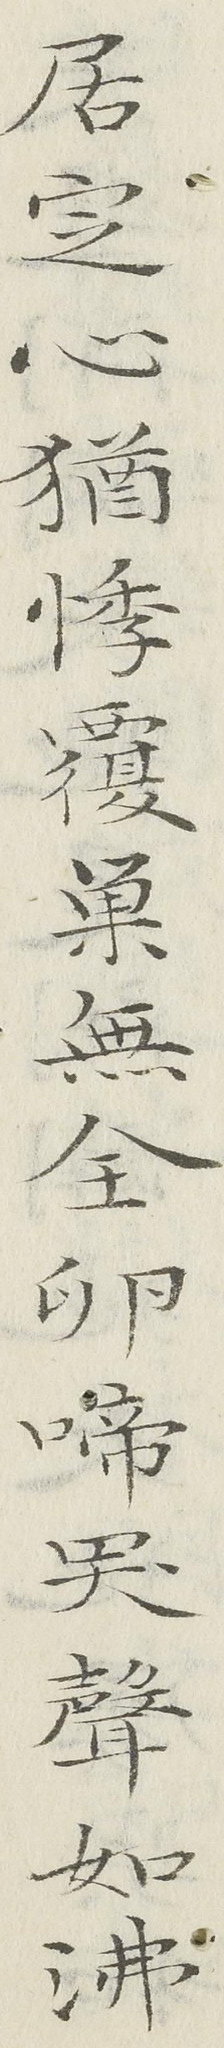居定心猶悸覆巣無全卵啼哭声如沸
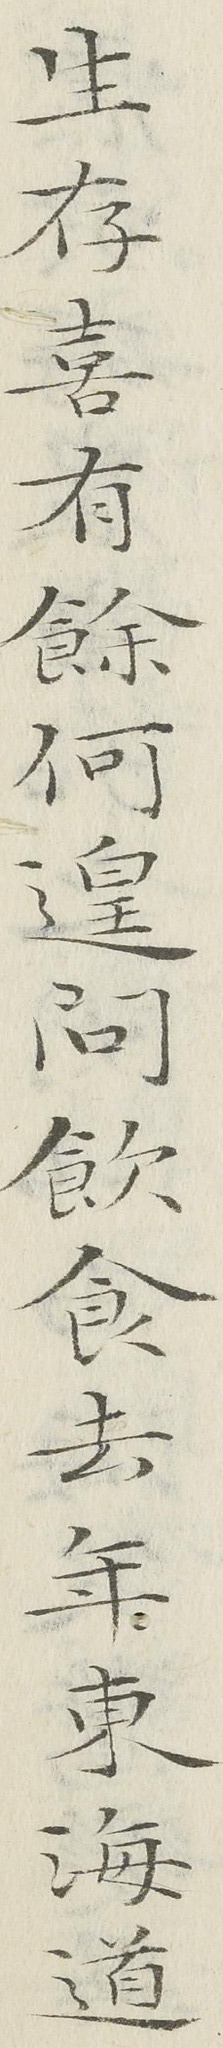生存喜有餘何遑間飲食去年東海道

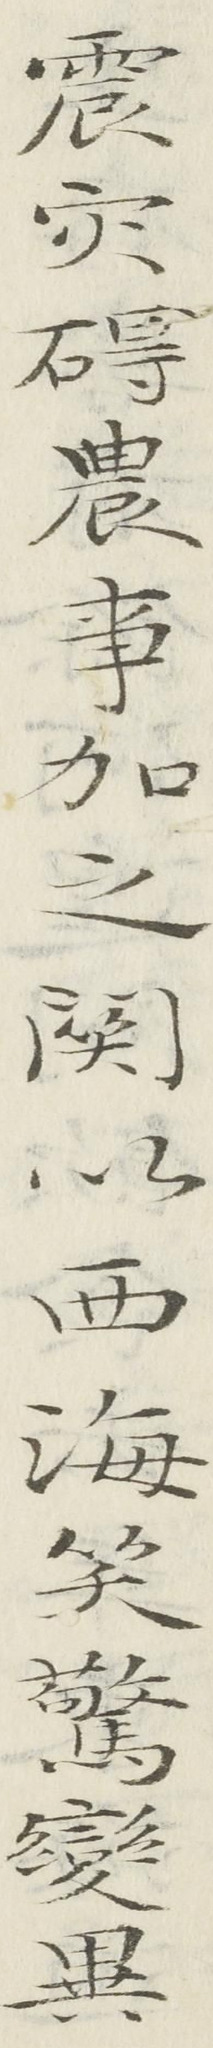震灾碍農事事加之関以西海笑驚変異
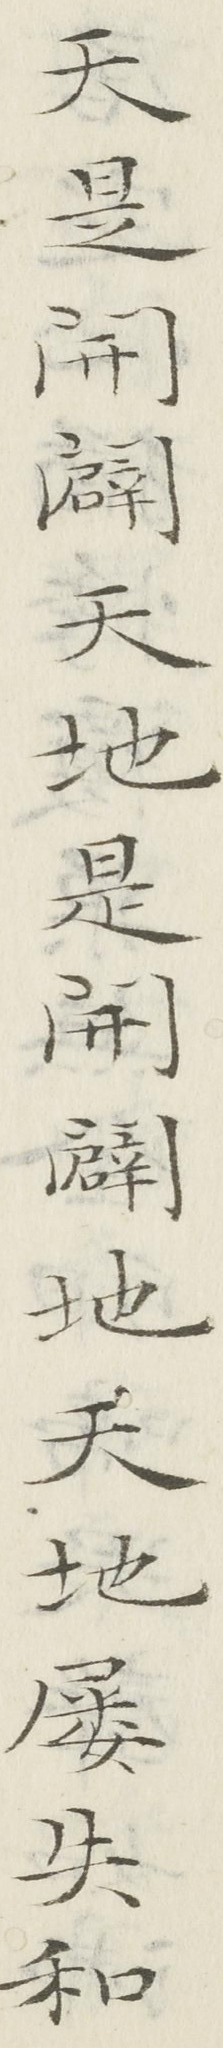天是開闢天地是開闢天地屡失和
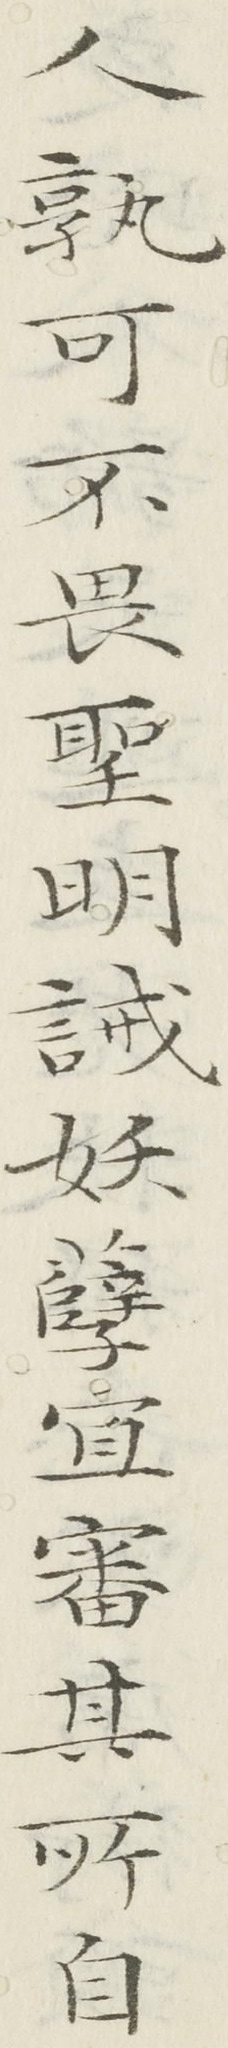人孰可不畏聖明誡妖孽宣審其所自
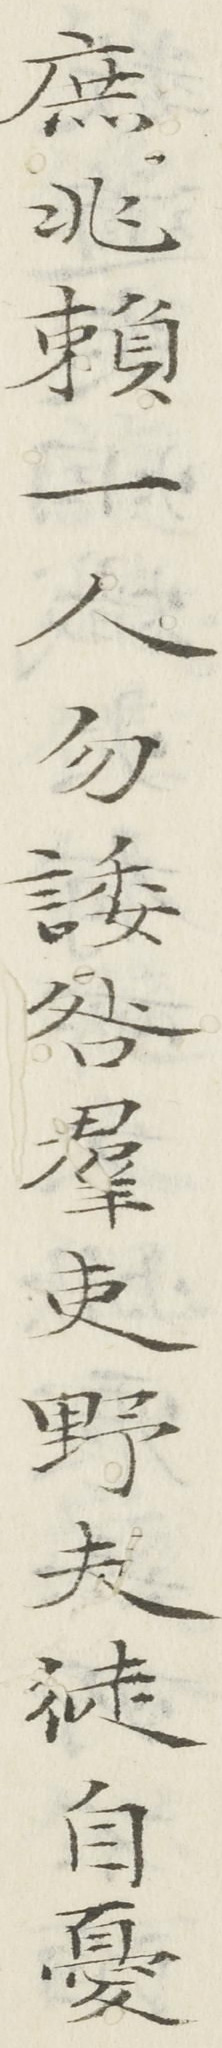庶兆頼一人勿諉咎群吏野夫徒自憂
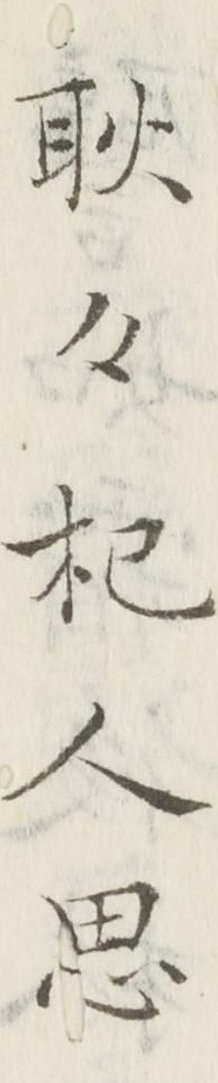耿々杞人思
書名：地震考證　全
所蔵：東京大学地震研究所図書室 Earthquake Research Institute Library, The University of Tokyo, JAPAN
